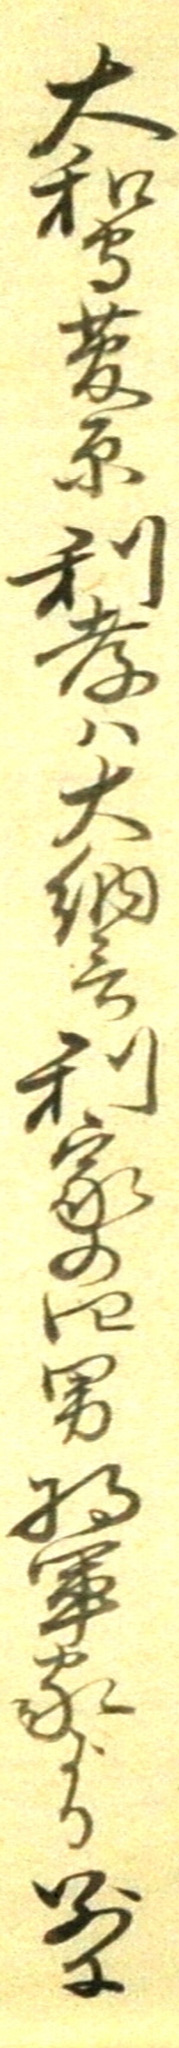大和守菅原利孝は大納言利家の四男将軍家より別に

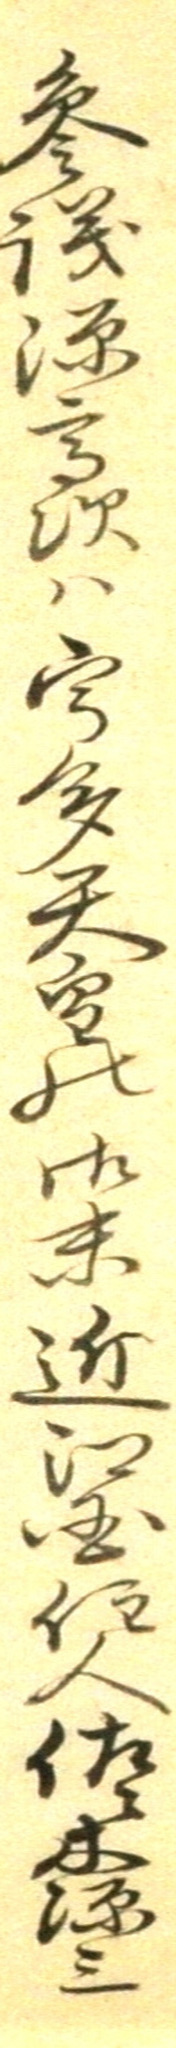参議源高次は宇多天皇の御末近江国住人佐々木源三
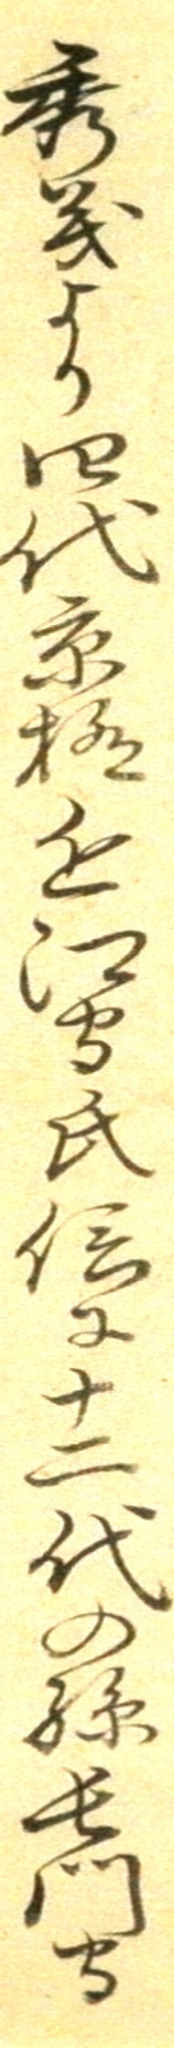秀義より四代京極近江守氏信に十二代の孫長門守
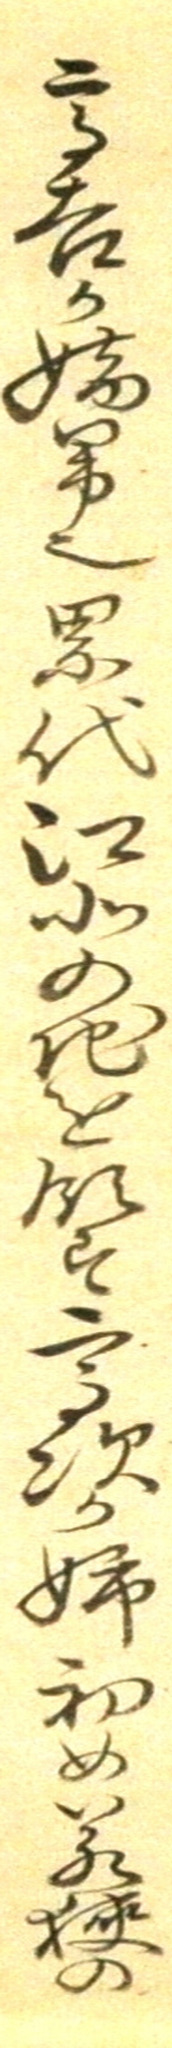高吉か嫡男也累代江北の地を領す高次か姉初め若狭の
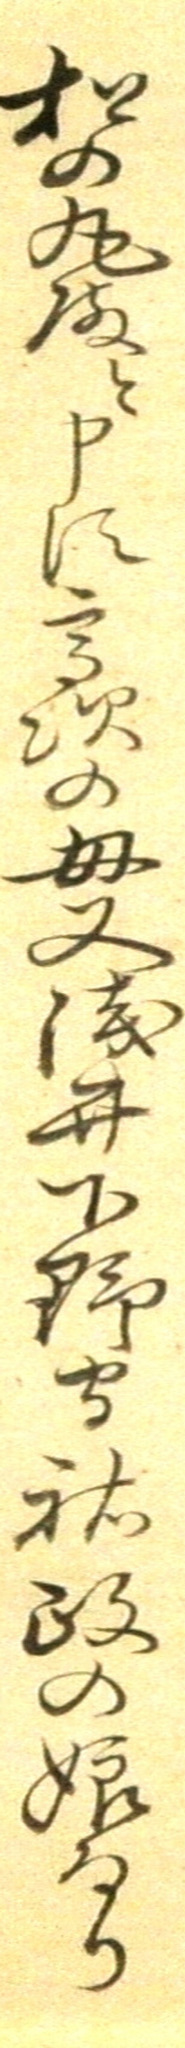松の丸殿と申す高次の母又浅井下野守祐政の娘なり
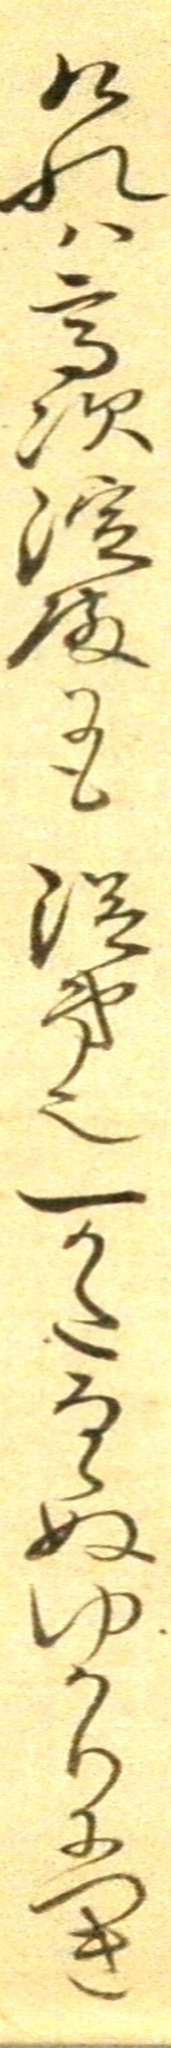けれは高次淀殿にも従弟也一かたならぬゆかりにつき
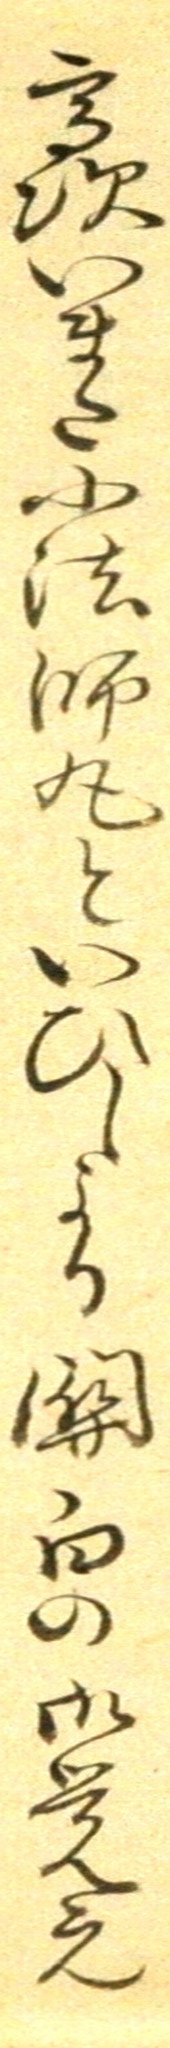高次いまた小法師丸といひしより関白の御覚え
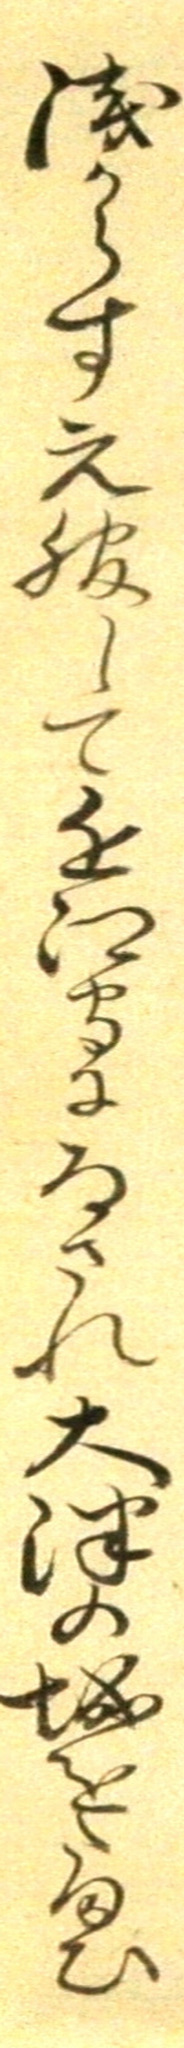浅からす元服して近江守になされ大津の城をたまひ

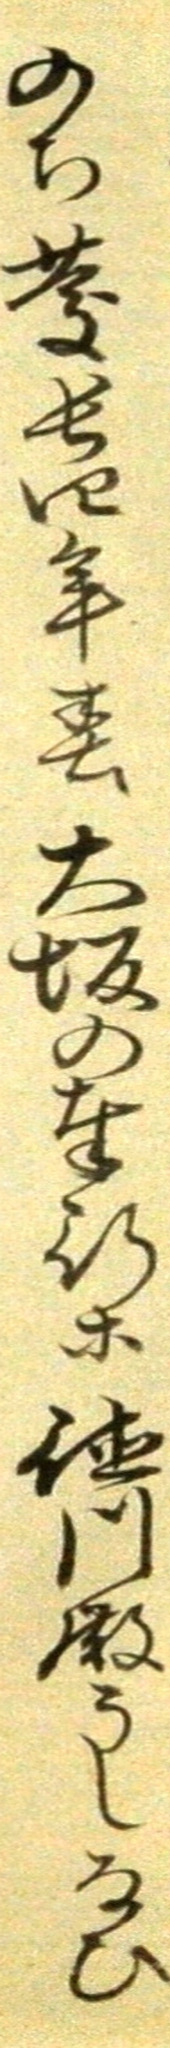のち慶長四年春大坂の奉行等徳川殿うしなひ
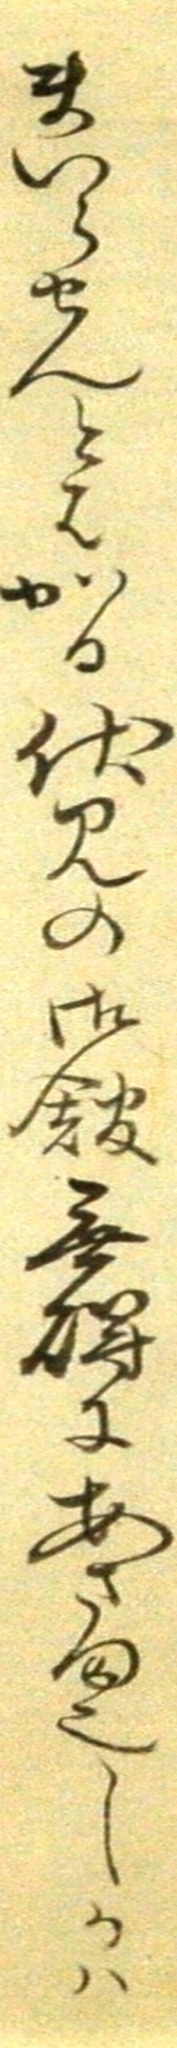まいらせんとはかる伏見の御館無碍にあさま也しかは
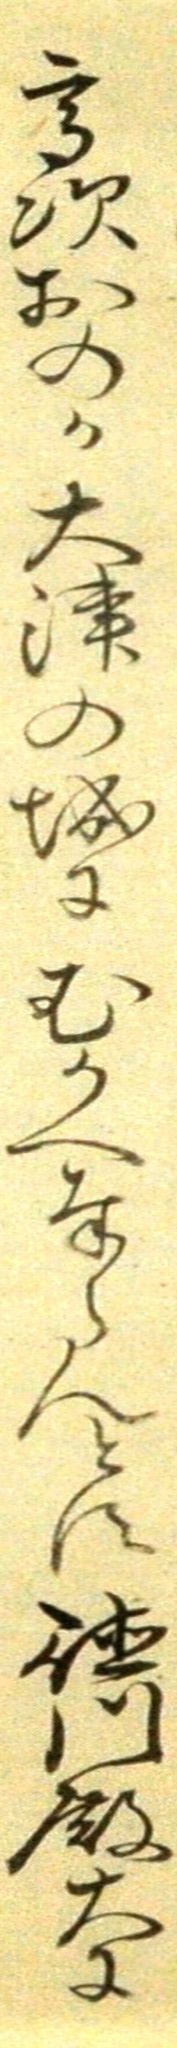高次おのか大津の城にむかへ奉らんとす徳川殿大に
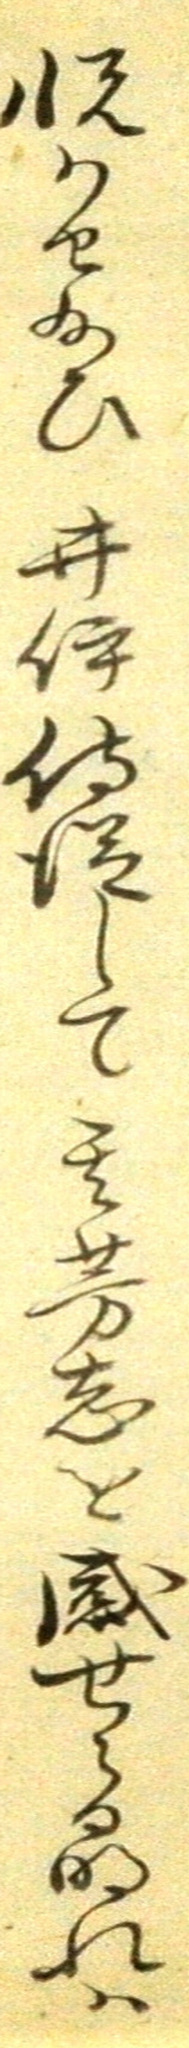悦はせ給ひ井伊侍従して其芳志を感せらる明れは
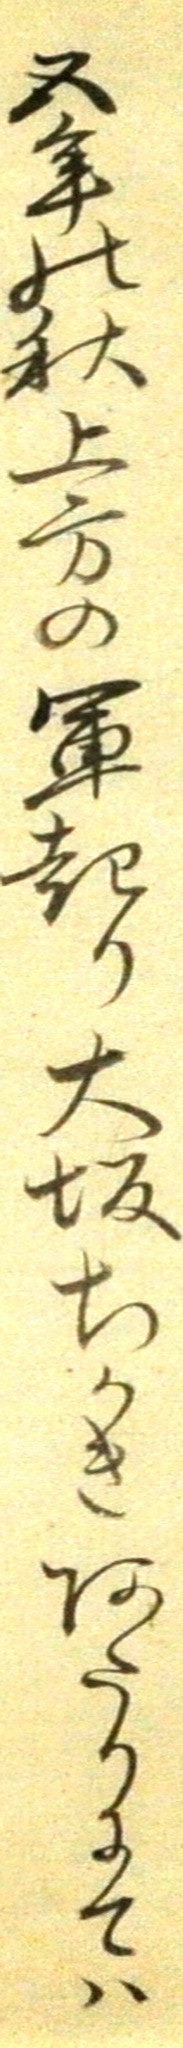五年の秋上方の軍起り大坂ちかきあたりにては
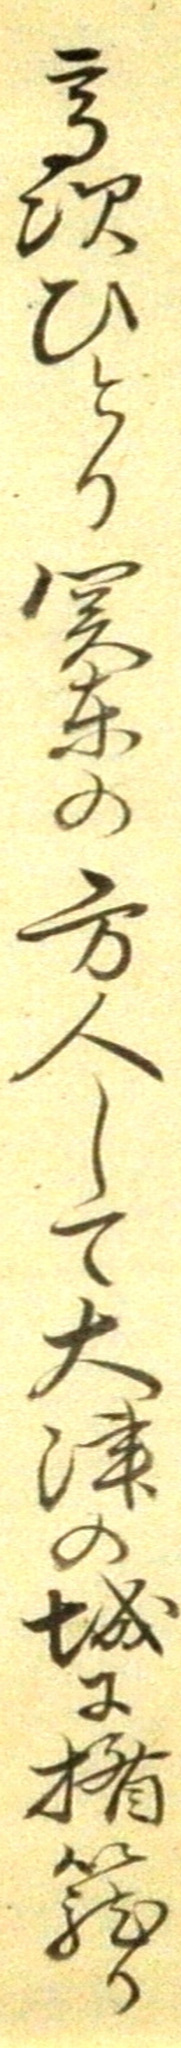高次ひとり関東の方人して大津の城に楯籠り
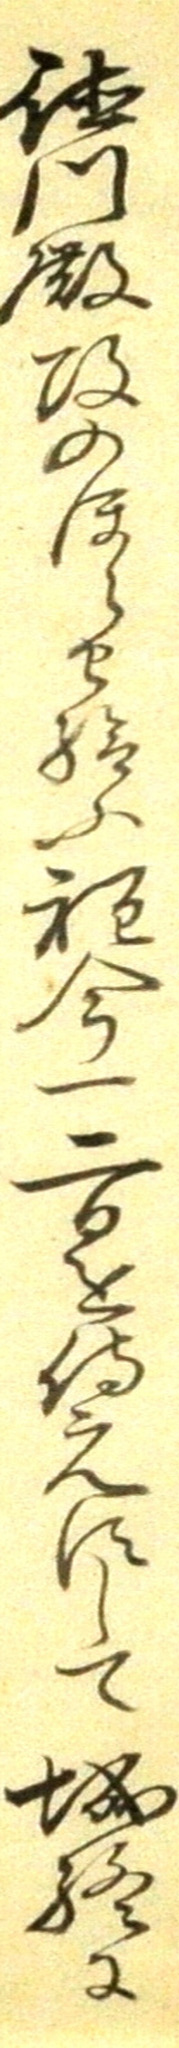徳川殿攻のほらせ給ふ程今一二日を待えすして城終に
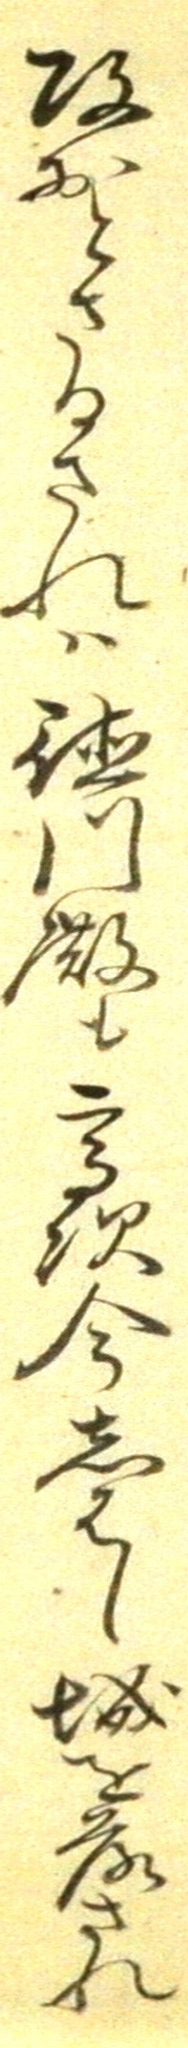攻おとさるされは徳川殿も高次今しはし城を落され
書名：藩翰譜（七・上）
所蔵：伊那市立高遠町図書館・合同会社AMANE
